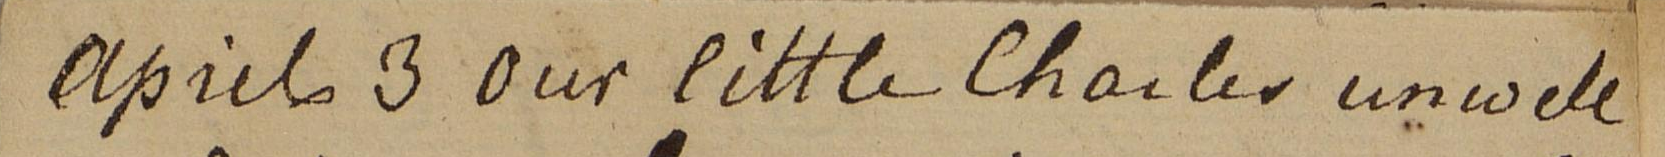April 3 our little Charles unwell
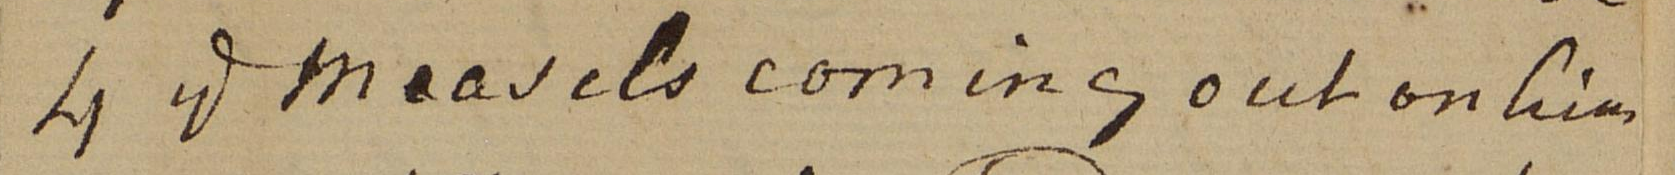4 y^e measels coming out on him
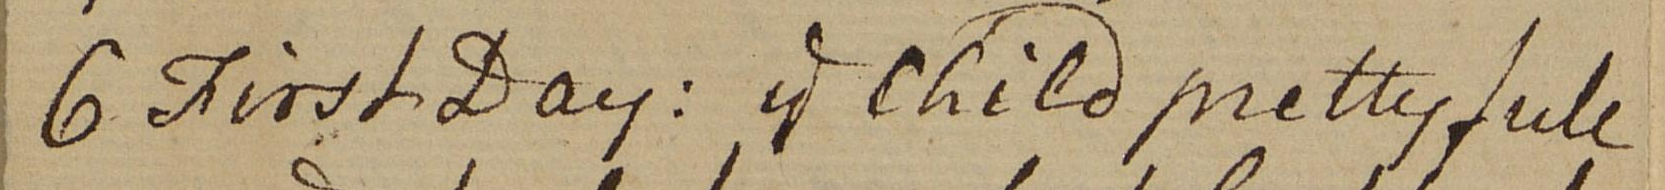6 First Day: y^e child pretty full
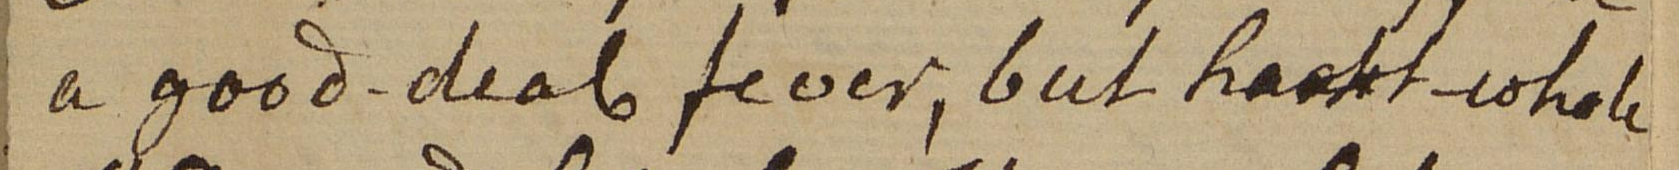a good-deal fever, but [hackt] whole
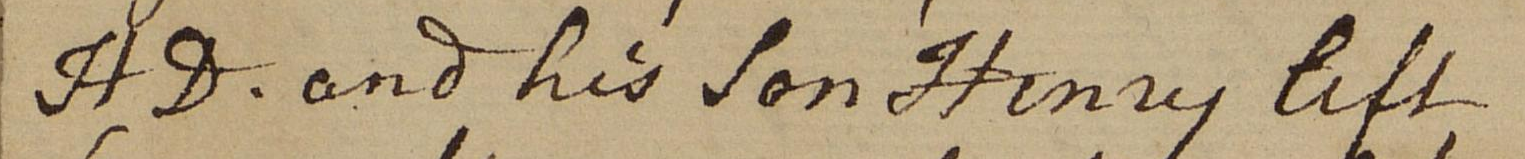HD. and his Son Henry left
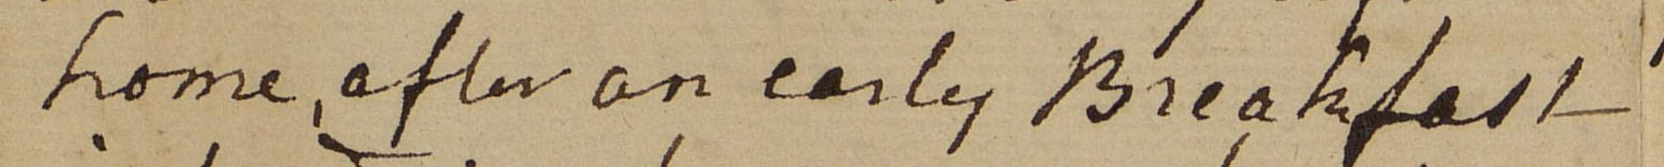home, after an early Breakfast
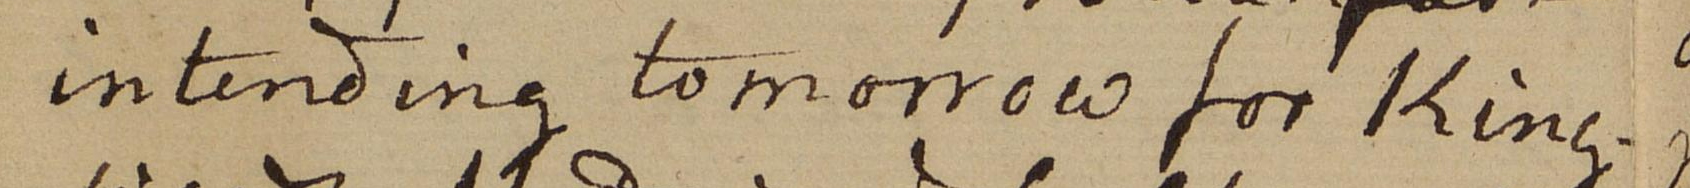intending tomorrow for King
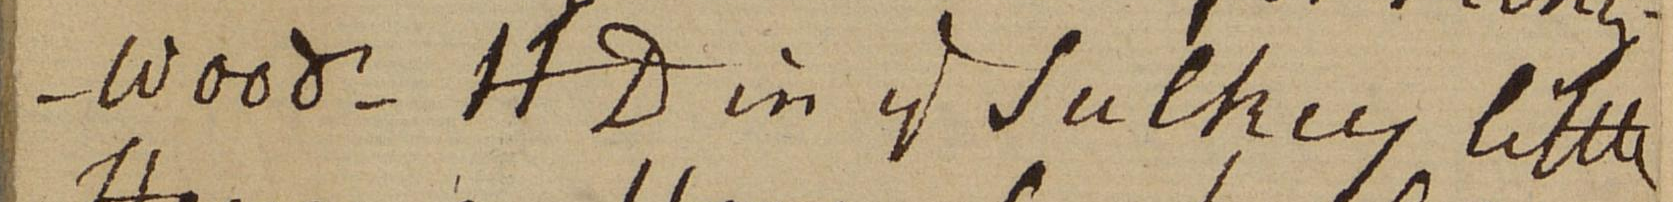-Wood- HD in y^e Sulkey little
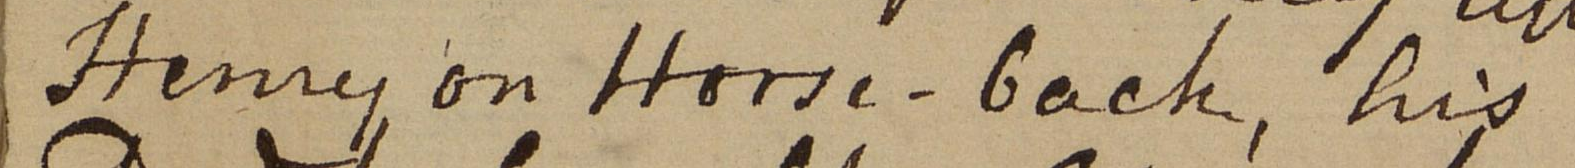Henry on Horse-back, his
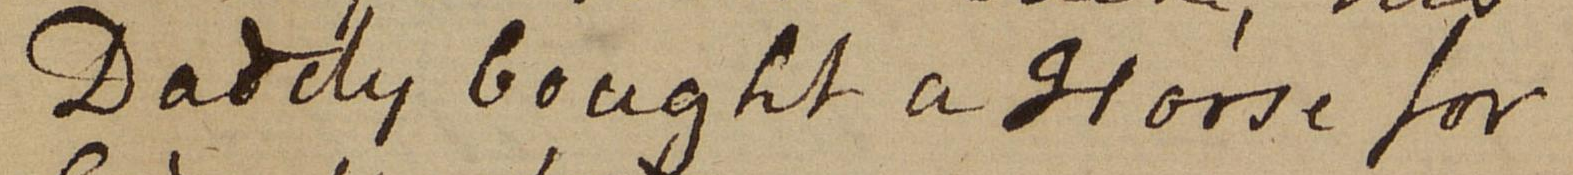Daddy bought a Horse for
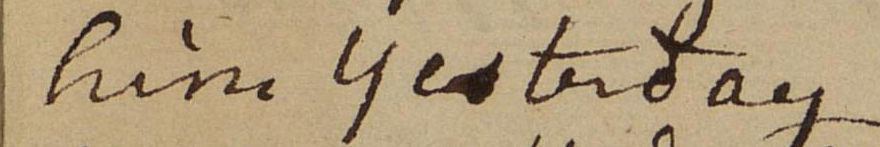him Yesterday
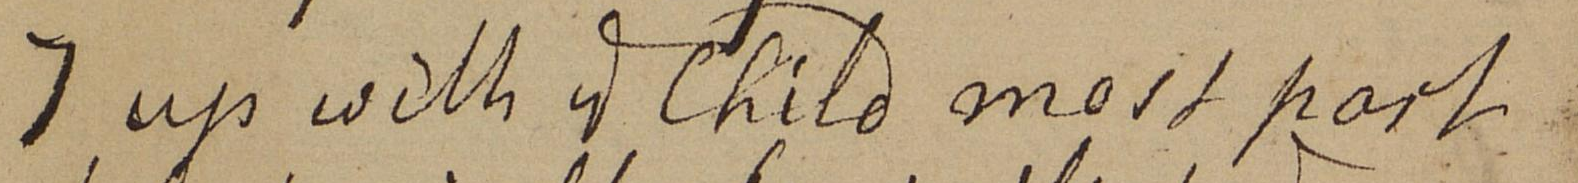7 up with y^e child most part
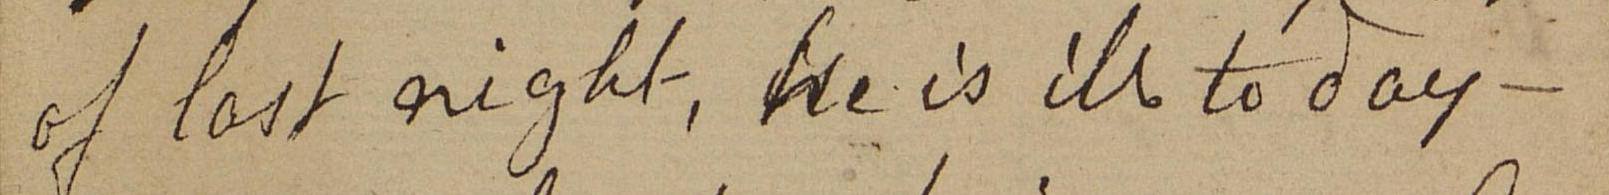of last night, he is ill to day-
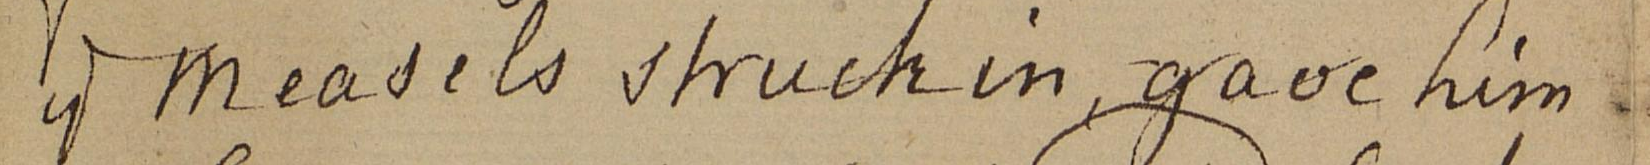y^e measels struck in gave him
